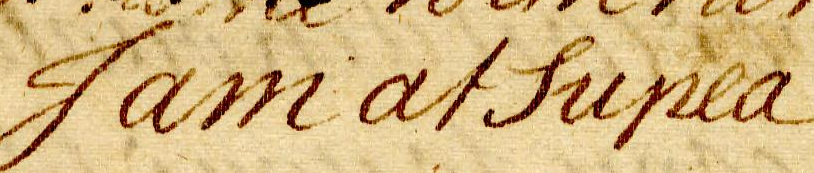I am at Supea
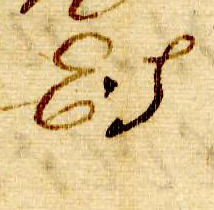E.S
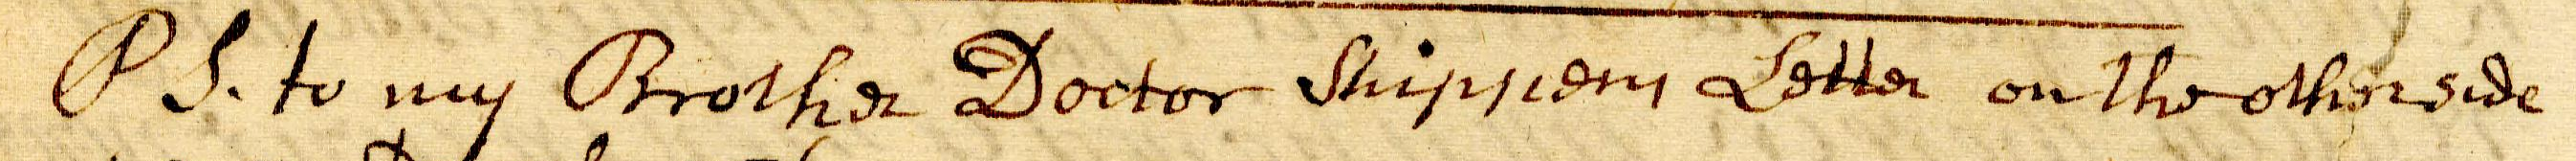PS. to my Brother Doctor Shippens Letter on the other side
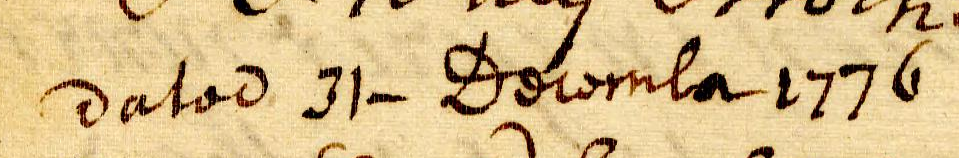dated 31- December 1776
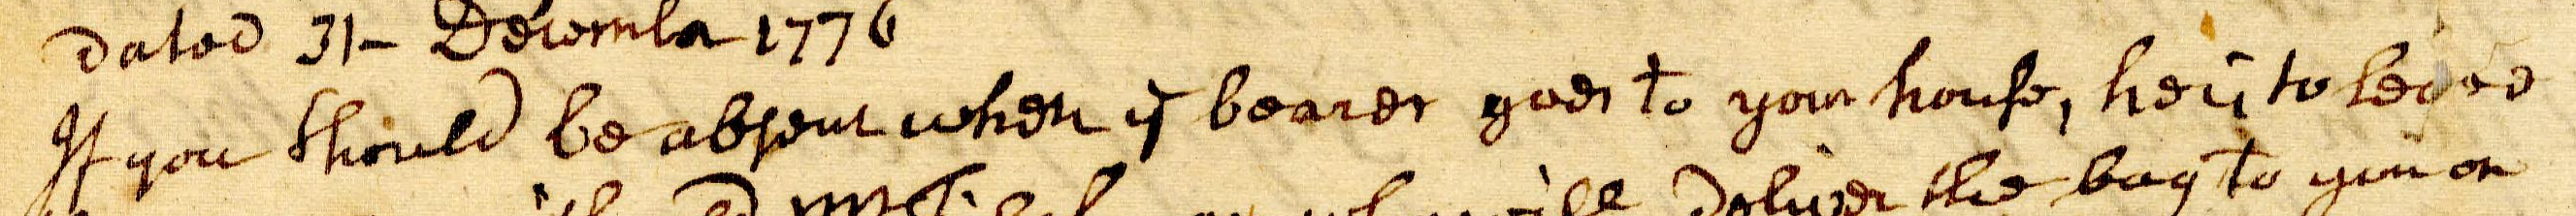If you Should be absent when y^e bearer gets to your house, he is to Leave
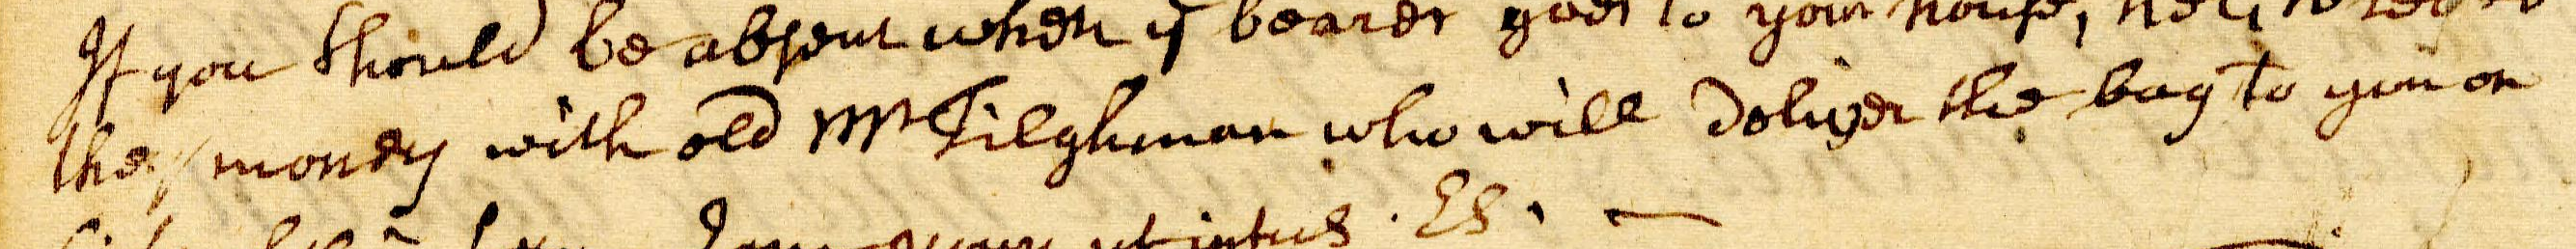The money with old M^r Tilghman who will deliver the bag to you on
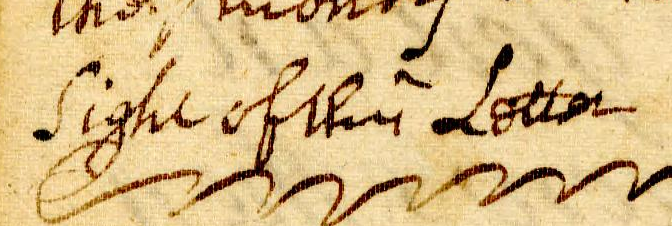Sight of this Letter
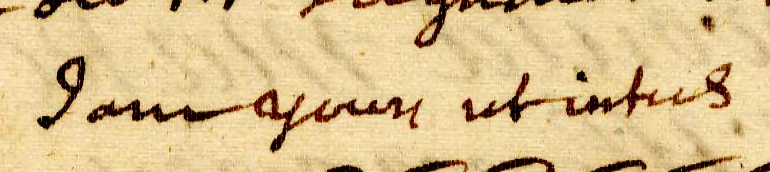I am yours ut infus
